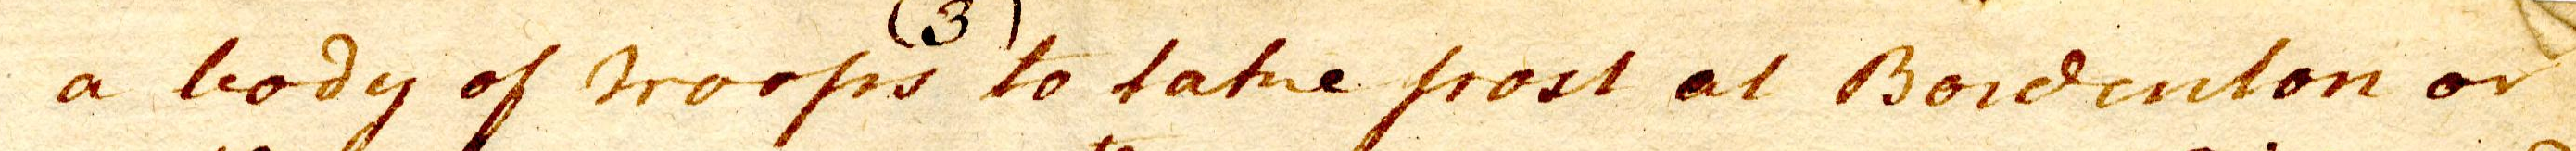a body of Troops to take post at Bordenton or
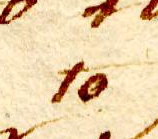to
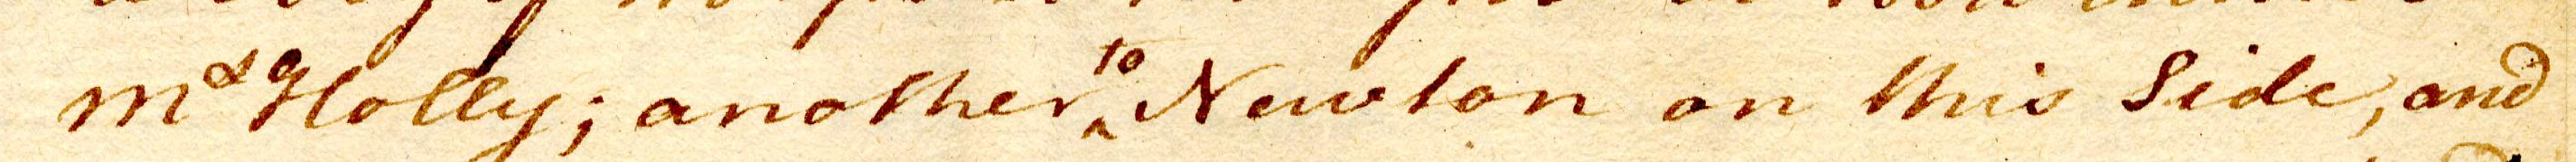M^t Holly; another ^ Newton on this Side, and
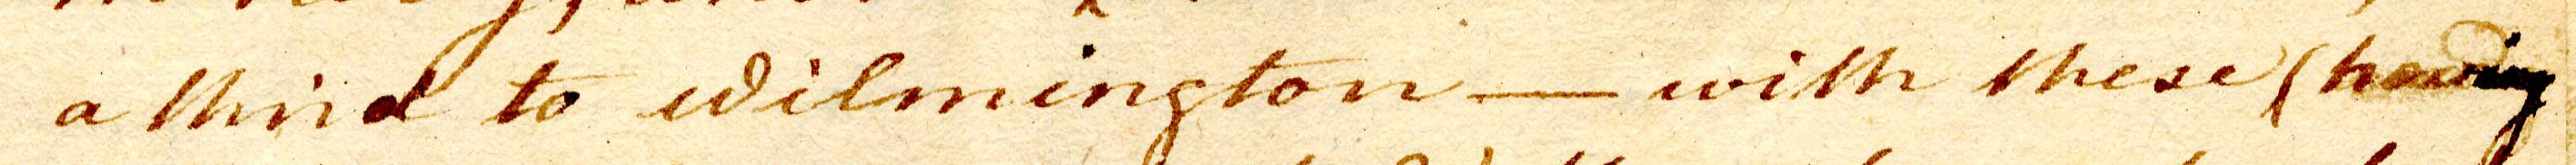a third to Wilmington- with these (having
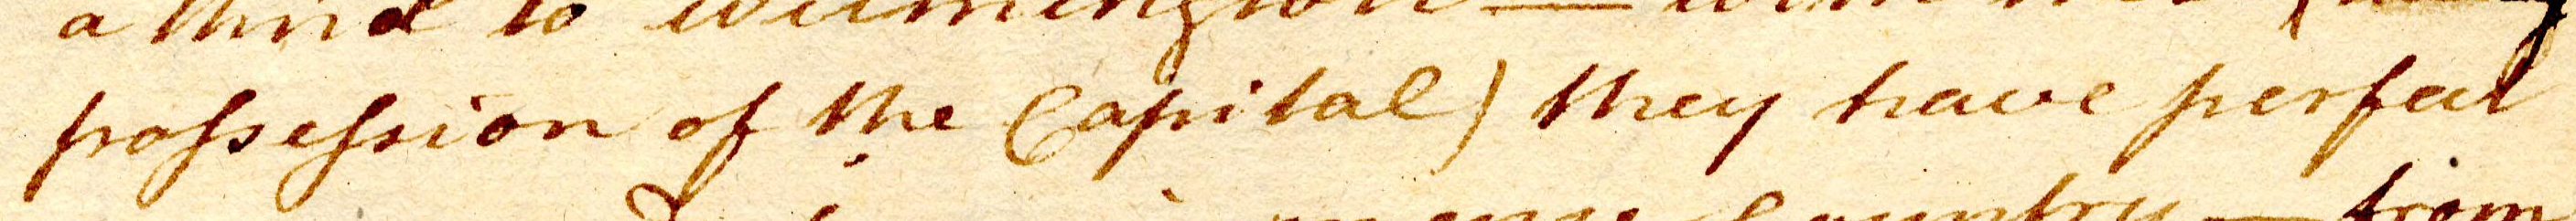possession of the Capital) they have perfect
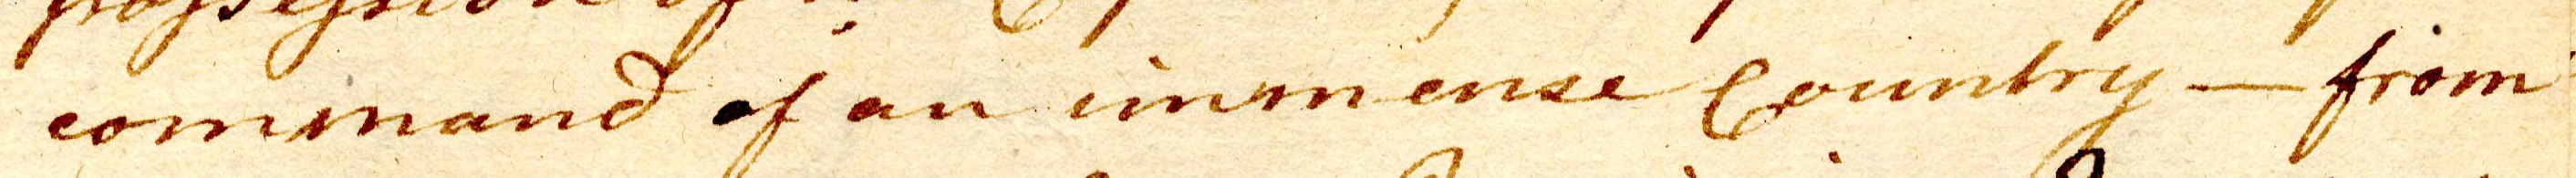command of an immense Country- from
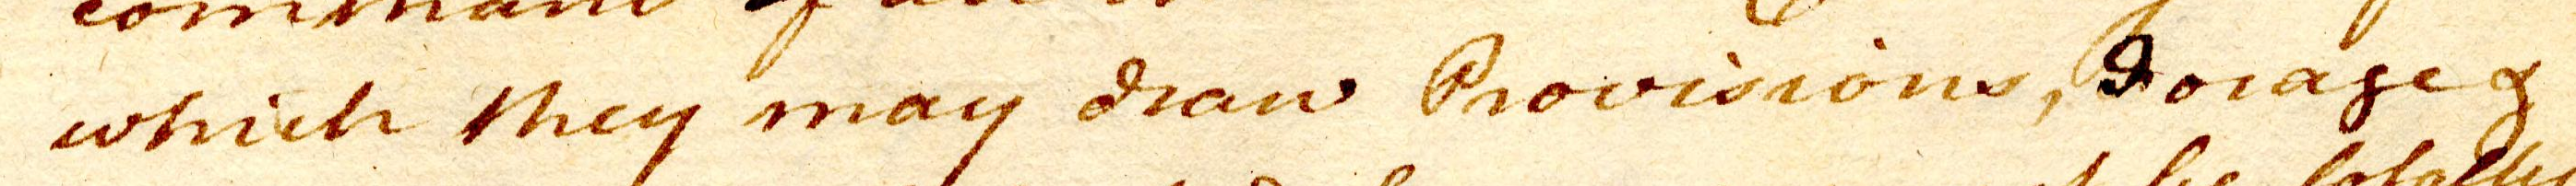which they may draw Provisions, Forage &
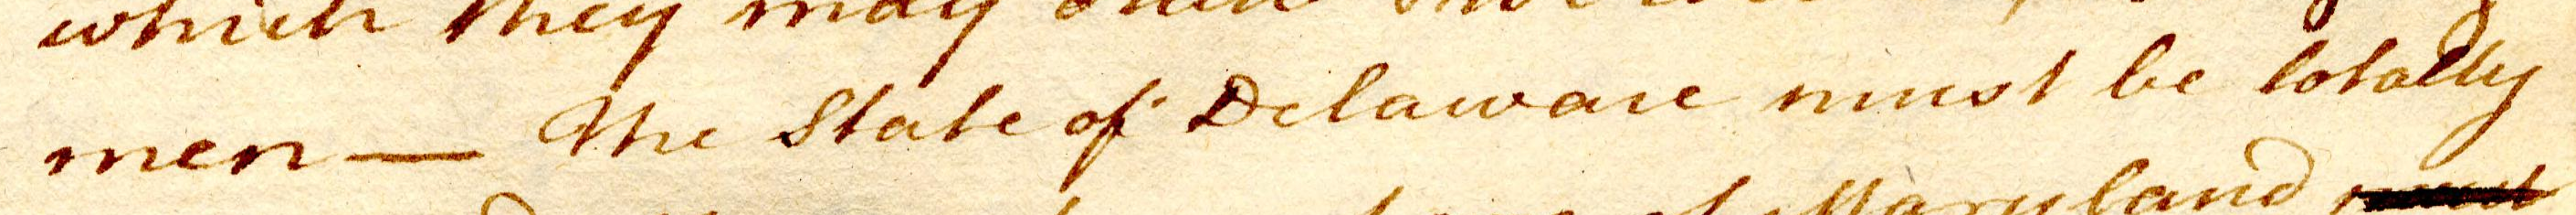men- The State of Delaware must be totally
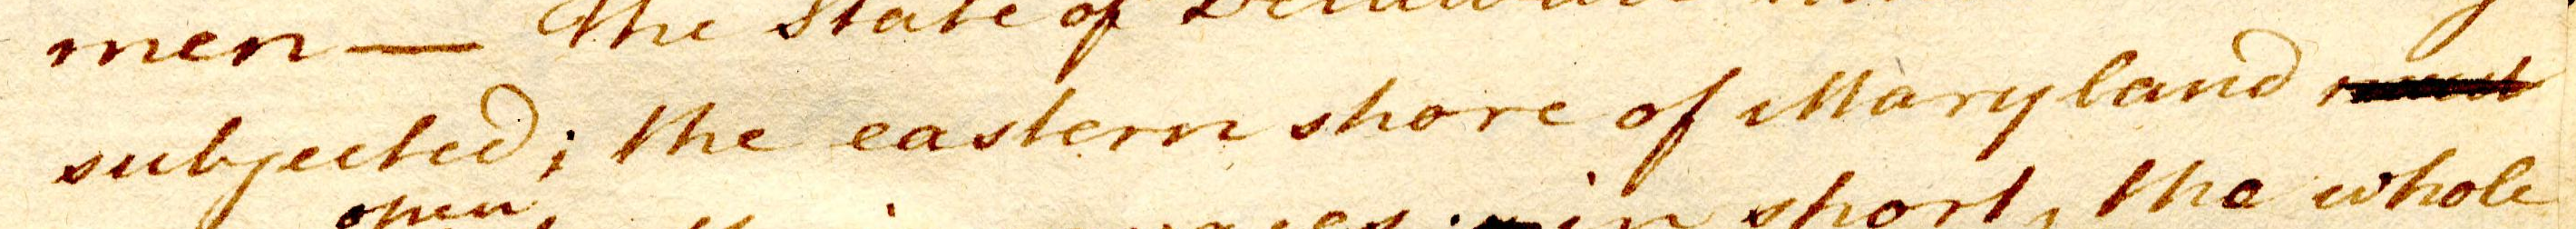subjected; the eastern shore of Maryland [must]
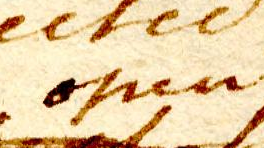open
